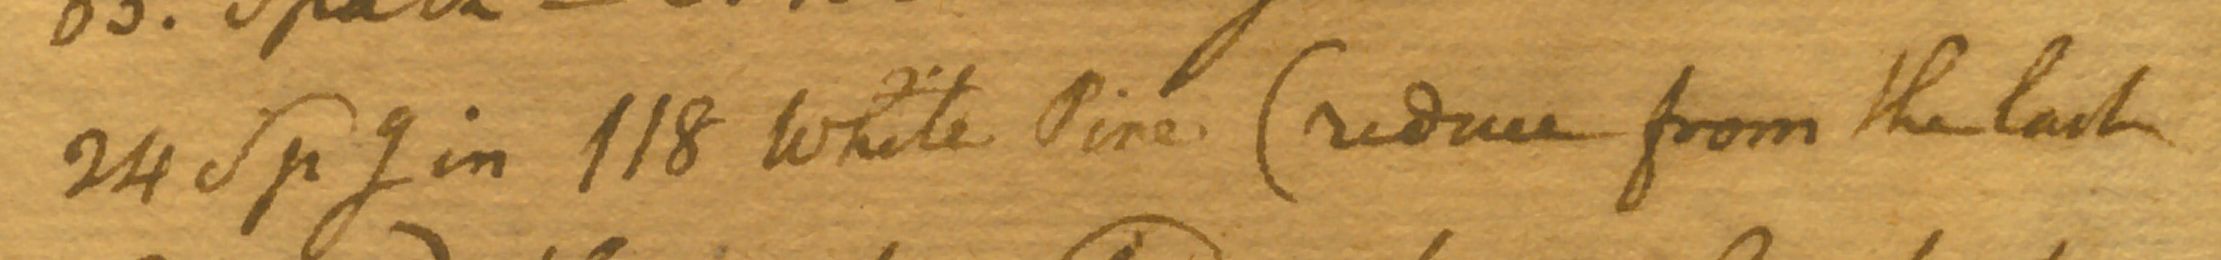13 Sp^g in 118 White Pine (reduce from the last
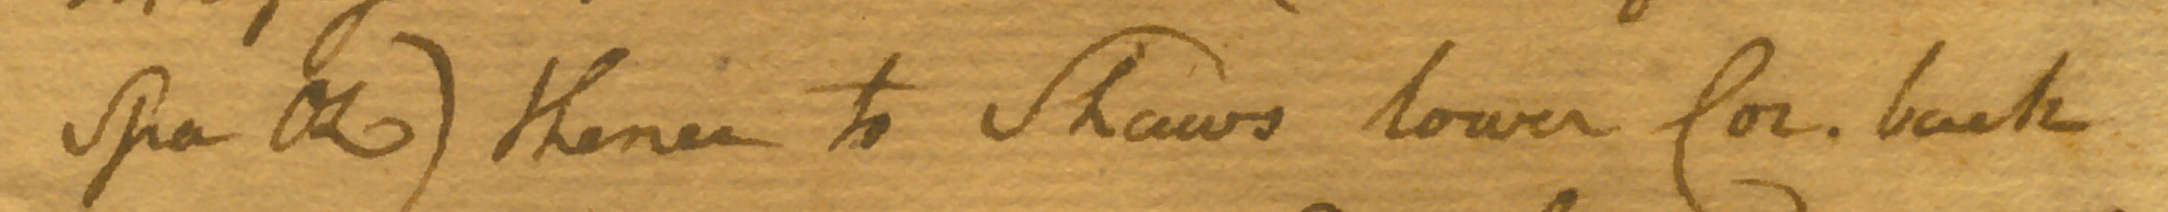Spa 0h) thence to Shaws lower Cor. back
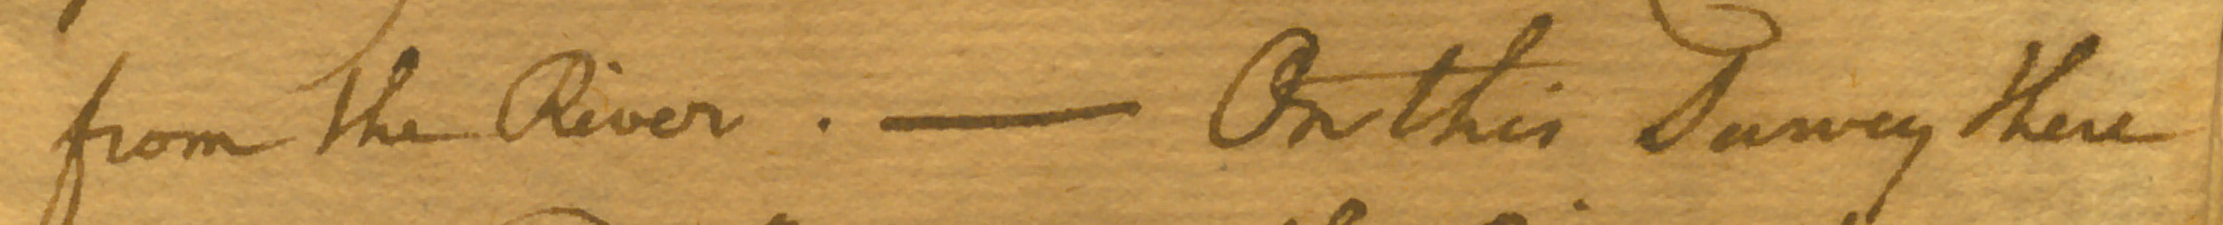from the River.- On this Survey there
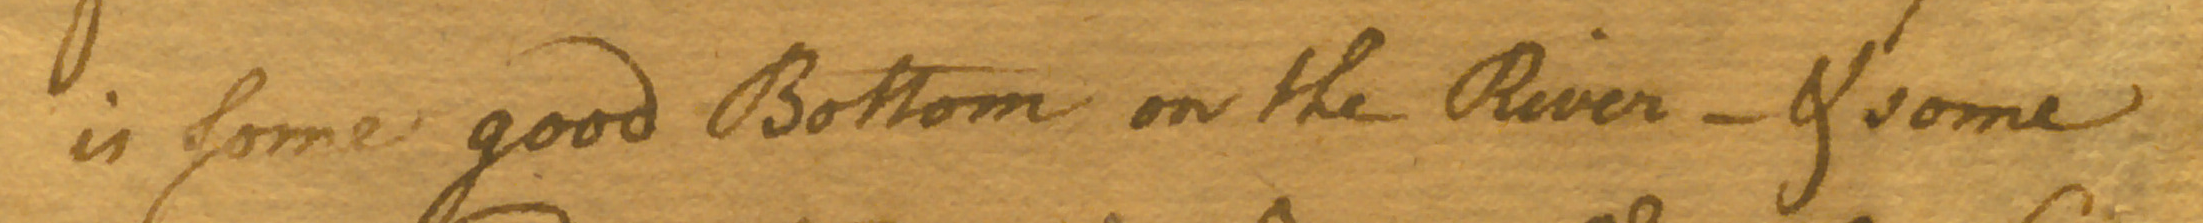in some good Bottom on the River- & some
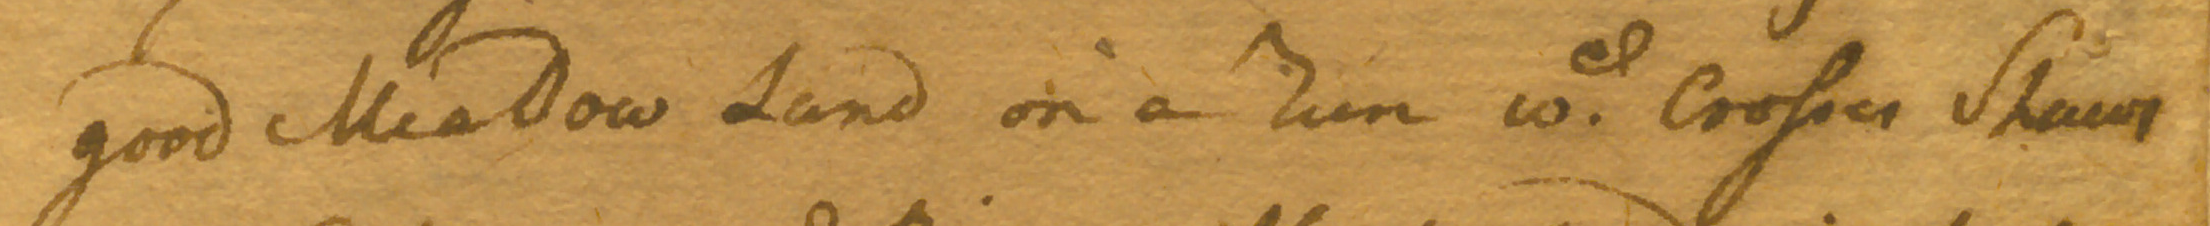good Meadow Land on a run w^ch. crosses Shaws
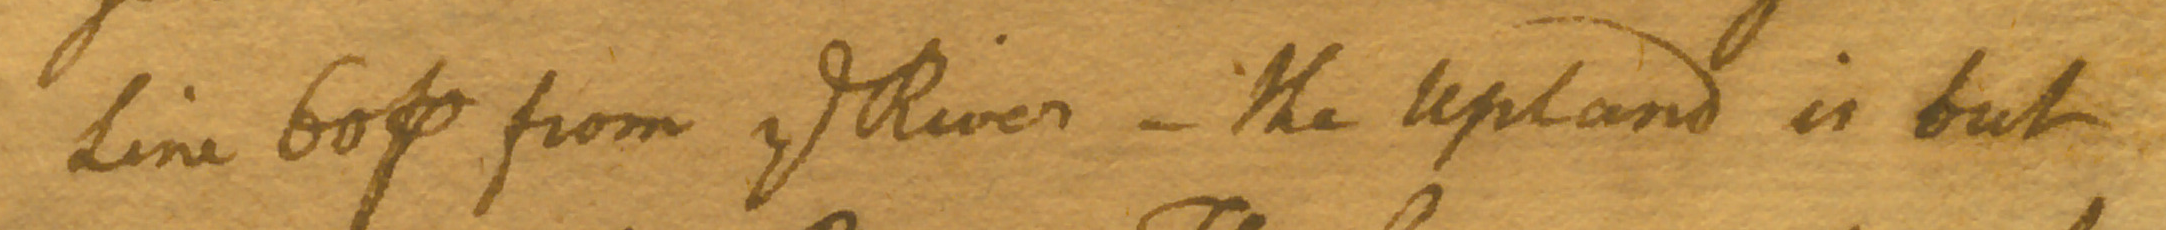Line 60 per from y^e River- the upland is but
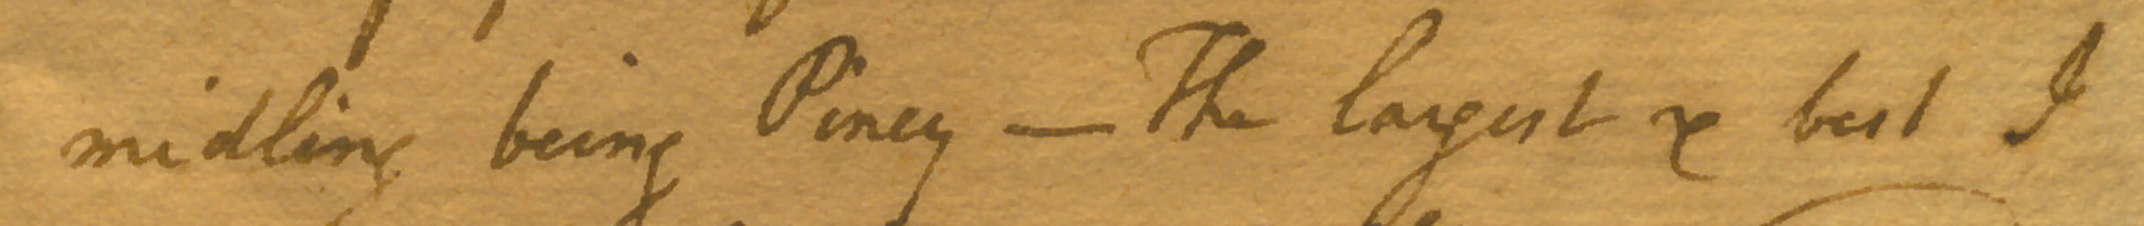midline being Piney- The largest & best I
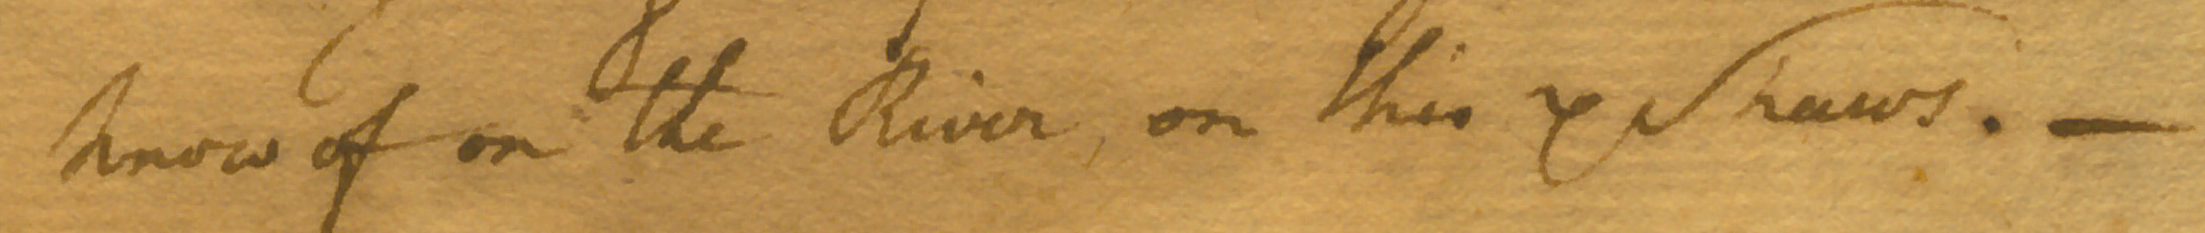know of on the River on this & Shaws.-
